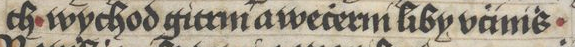ch.wychod gitrní a weċerní liby vċíníṡ.
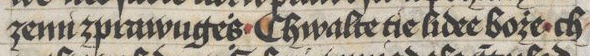zemi zprawugeṡ.Chwalte tie lidee boże.ch¬
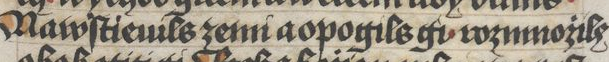Nawẛtieuils zemi a opogils gi.rozmnożils
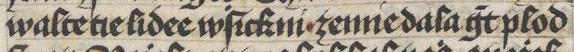walte tie lidee wẛickni.zemie dala ḡt plod
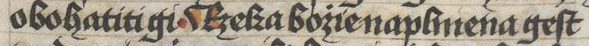obohatiti gi.Rzeka bożie naplnena geſt
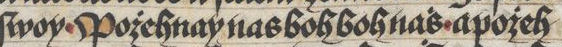ſwoy.Pożehnay nas boh boh naṡ.apożeh
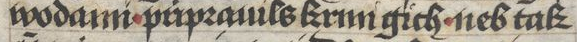wodami.pṙiprauils krmi gich.neb tak
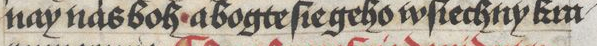nay nas boh.a bogte ſie geho wẛiechny kra¬
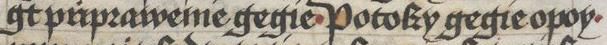ḡt pṙiprawenie gegíe.Potoky gegíe opoy.
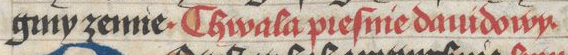giny zemie.Chwala pieſnie dauidowy.
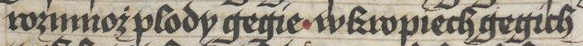rozmnoż plody gegíe.wkropíech gegích
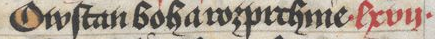Owſtan boha rozprchnie.lxvij.
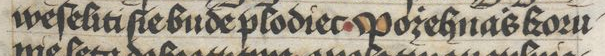weſeliti ſie bude plodiec.Pożehnaṡ koru¬
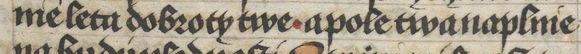níe leta dobroty twe.a pole twa naplnie¬
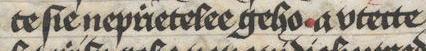te ſie nepṙietelee geho.a vtecte
